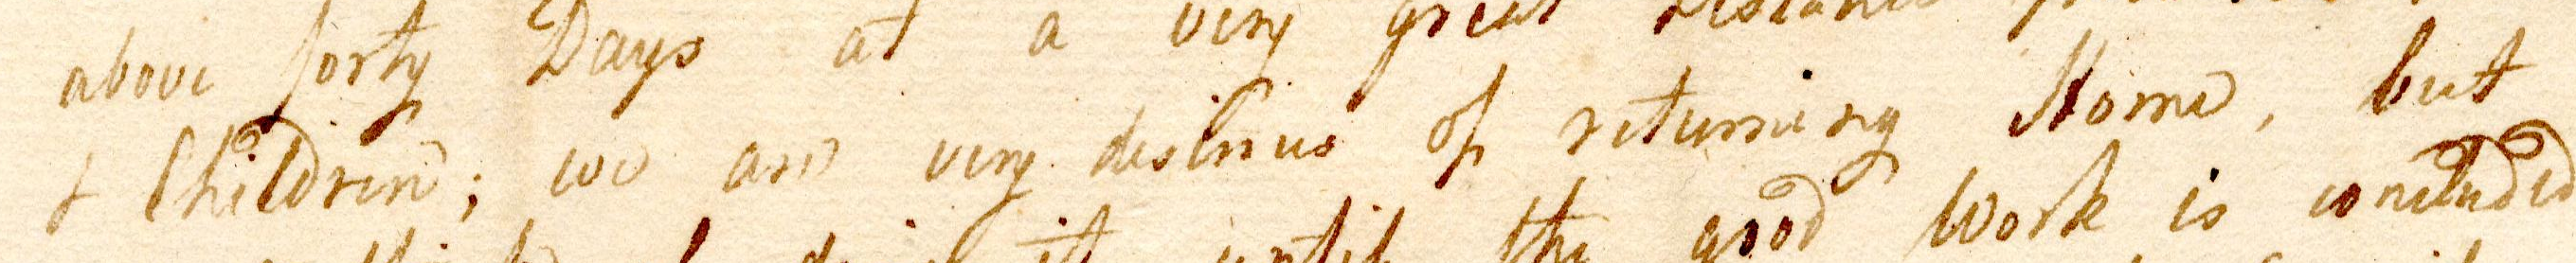& Children; we are very desirous of returning Home, but
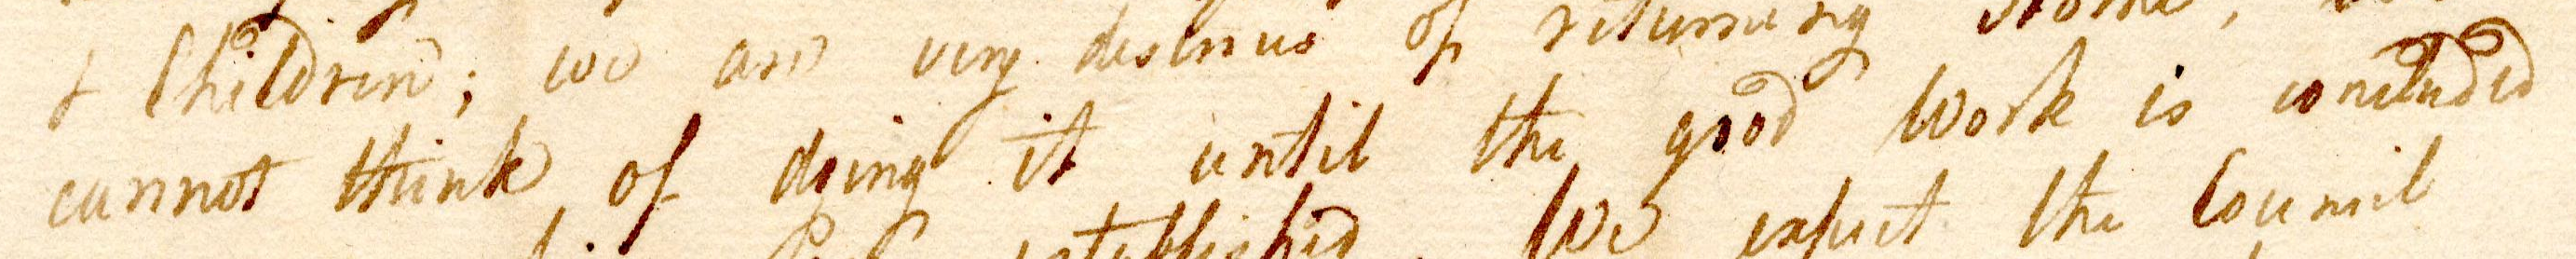cannot think of doing it until the good work is concluded
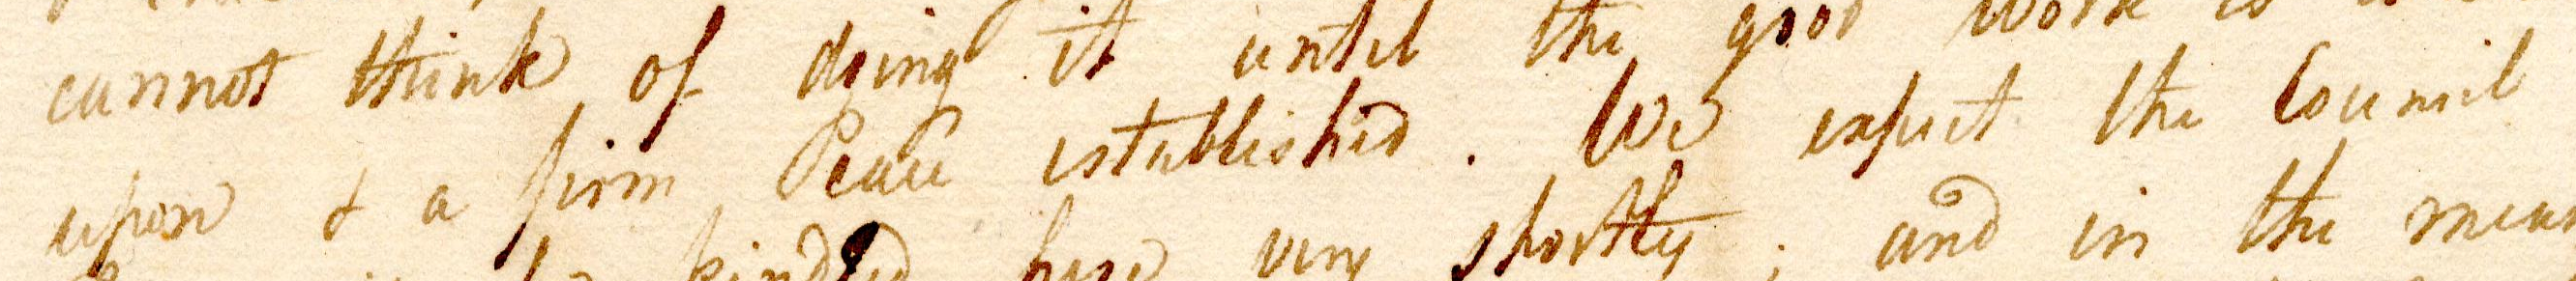upon & a firm Peace established. We expect the Council
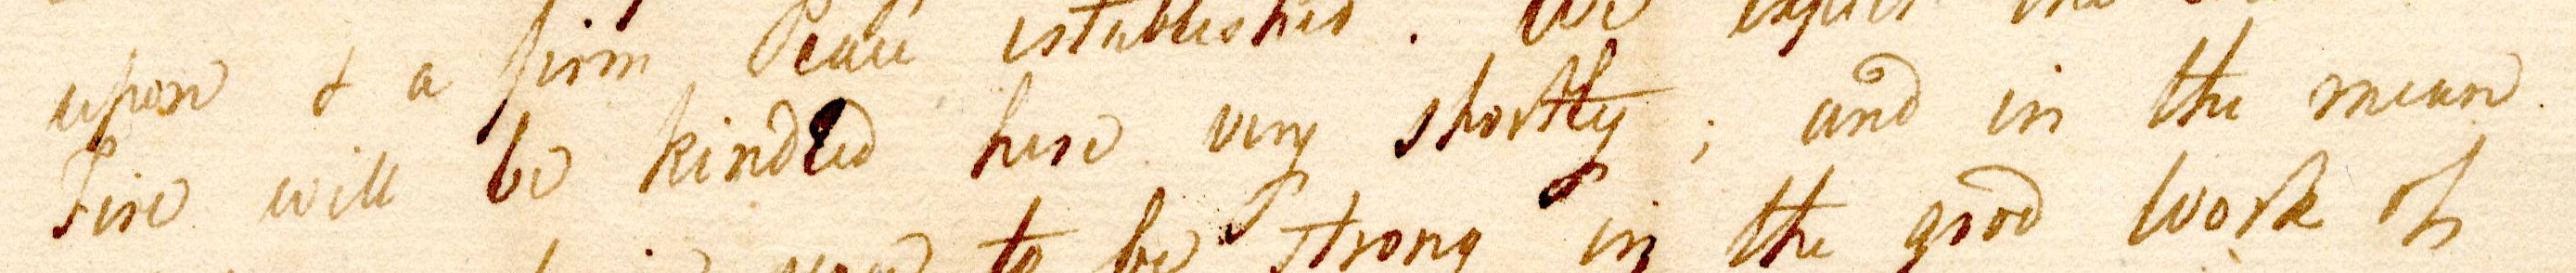Fire will be kindled here very shortly; and in the mean
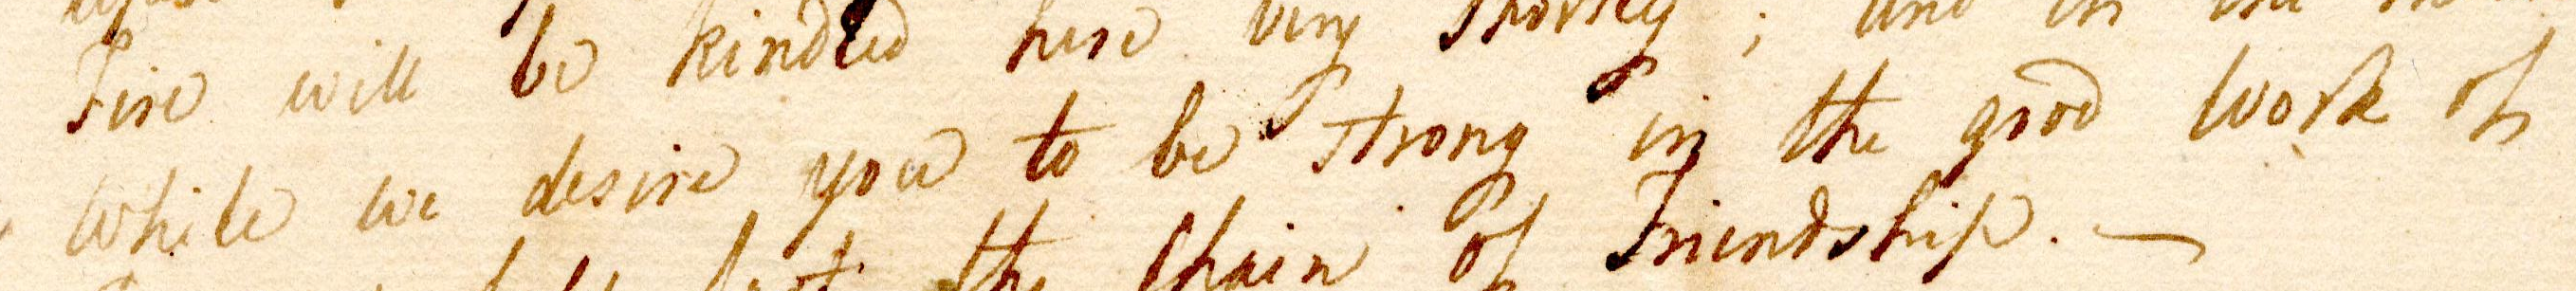while we desire you to be strong in the good work of
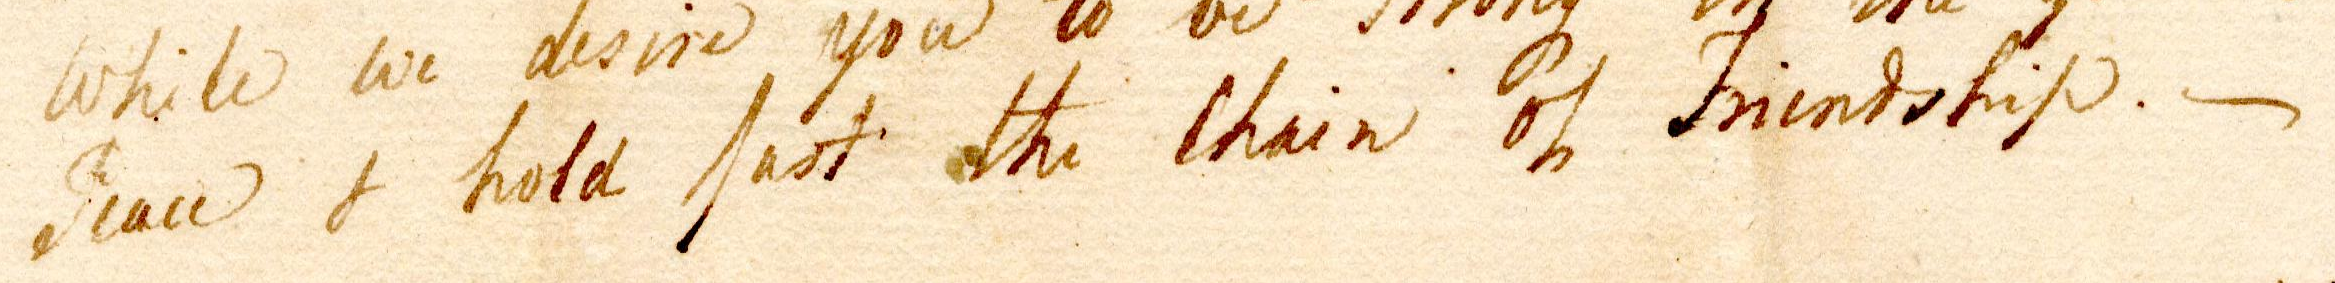Peace & hold fast the Chain of Friendship.-
